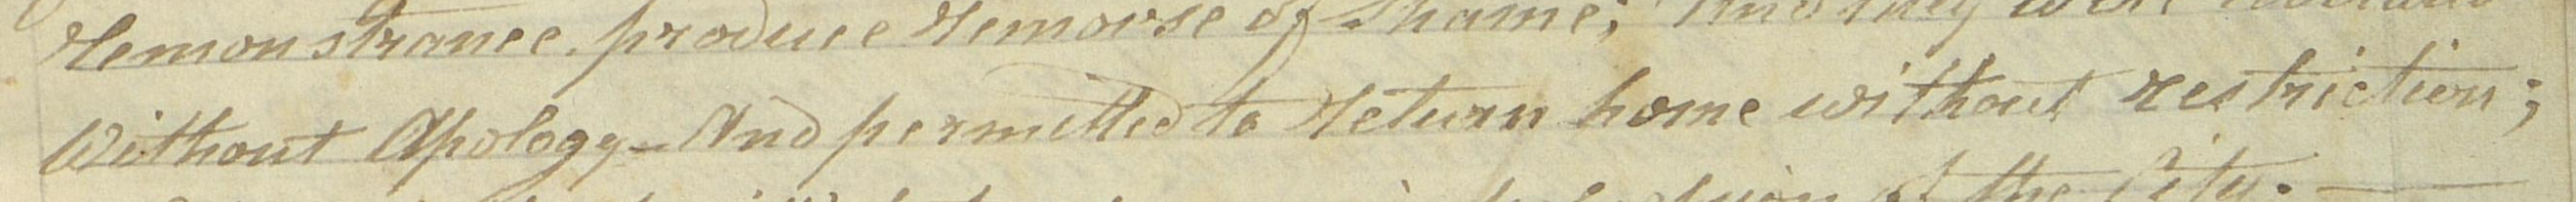Without Apology, and permitted to return home without restriction;
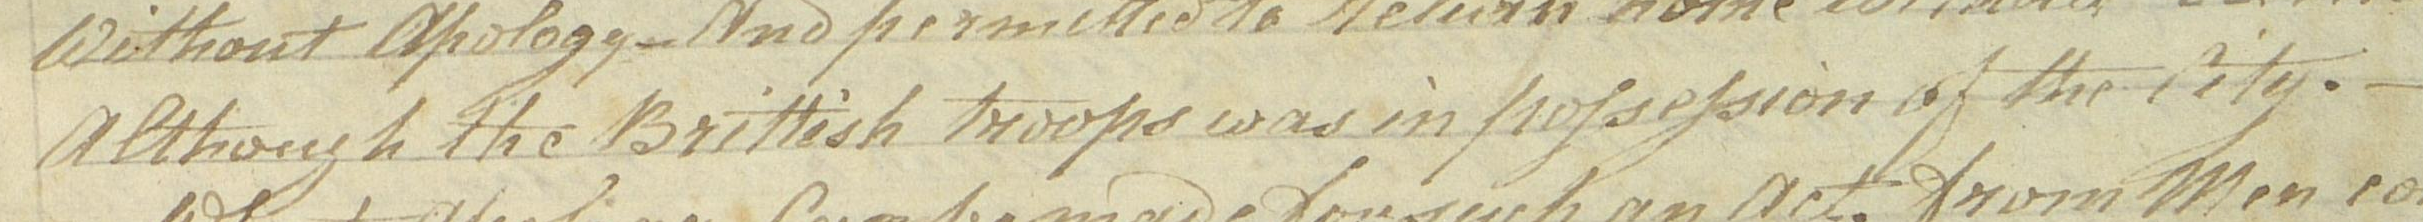Although the Brittish troops was in possession of the City.
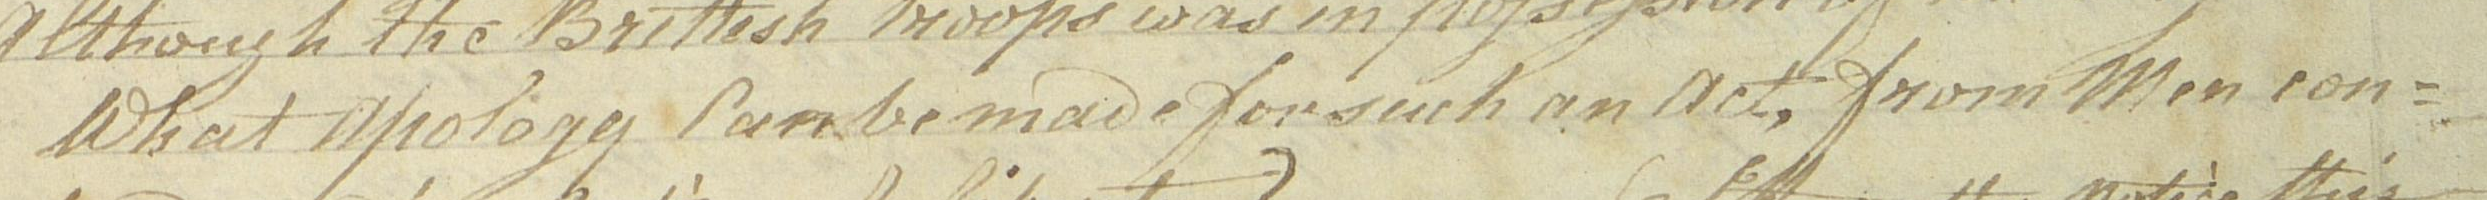What Apology Can be made for such an Act, from Men con-
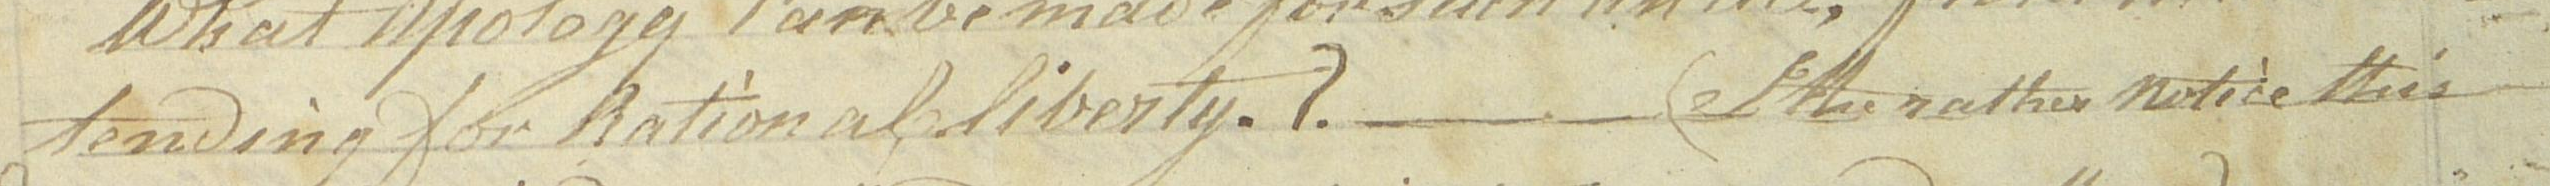tending for Rational liberty? (the rather notice this
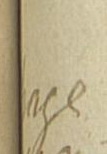page
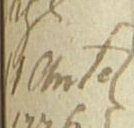11 Ante
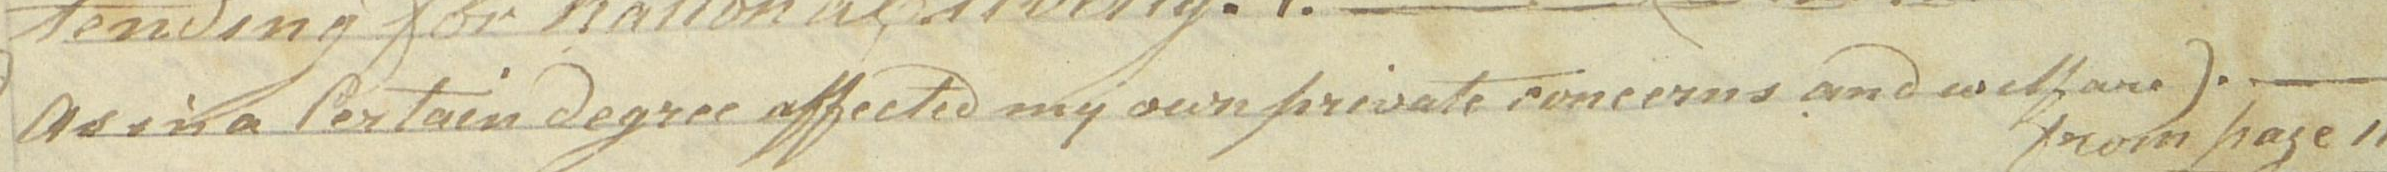As in a Certain degree affected my own private concerns and welfare).
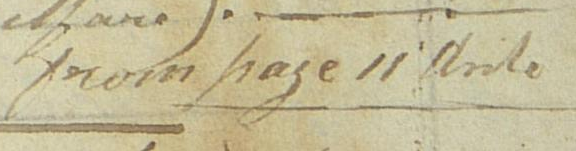From page 11 Ante
